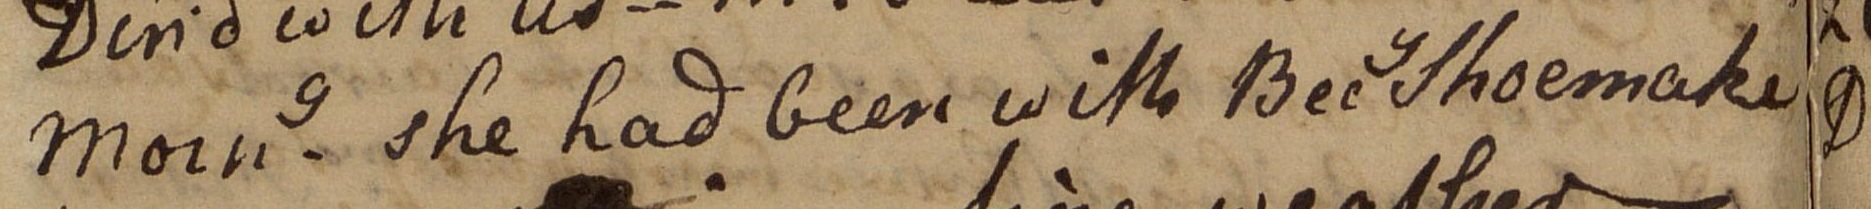Morn.^g- she had been with Bec^y Shoemake
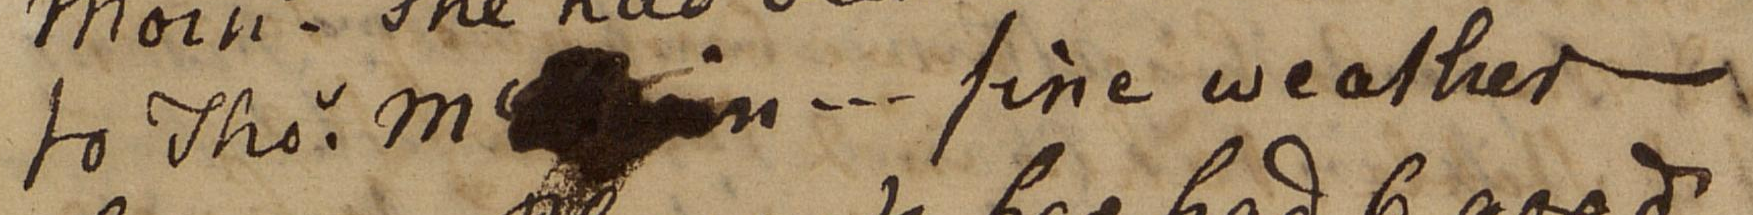to Tho.^s M[iffl]in- fine weather
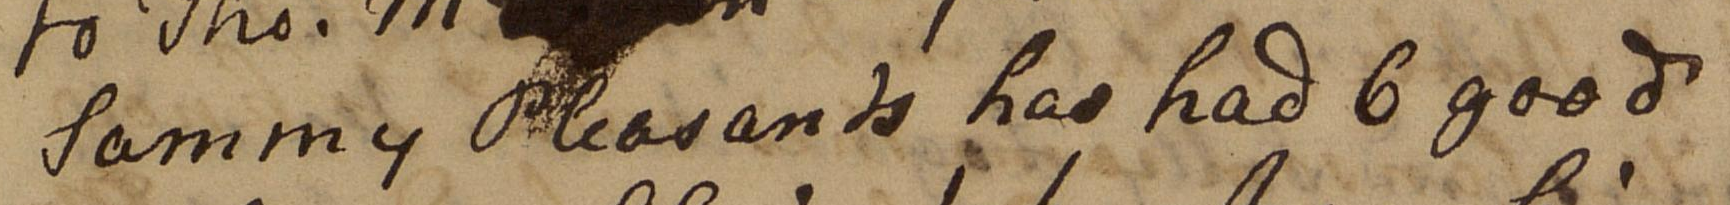Sammy Pleasants has had 6 good
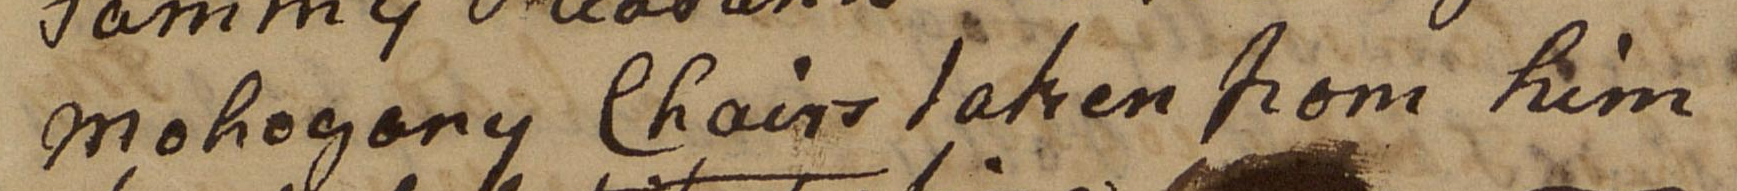Mohogany Chairs taken from him
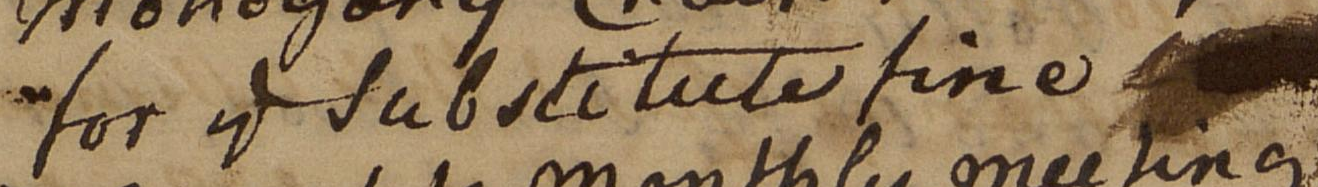for y^e substitute fine [__]
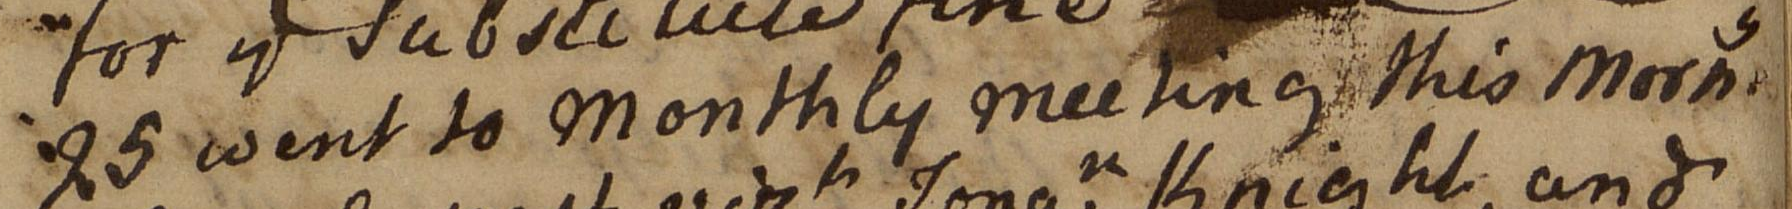25 went to Monthly meeting this Morn.^g
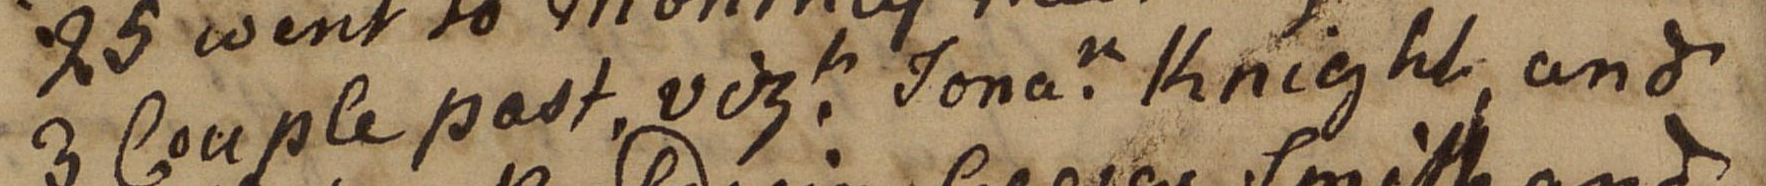3 couple past, viz^h. Jona^n Knight, and
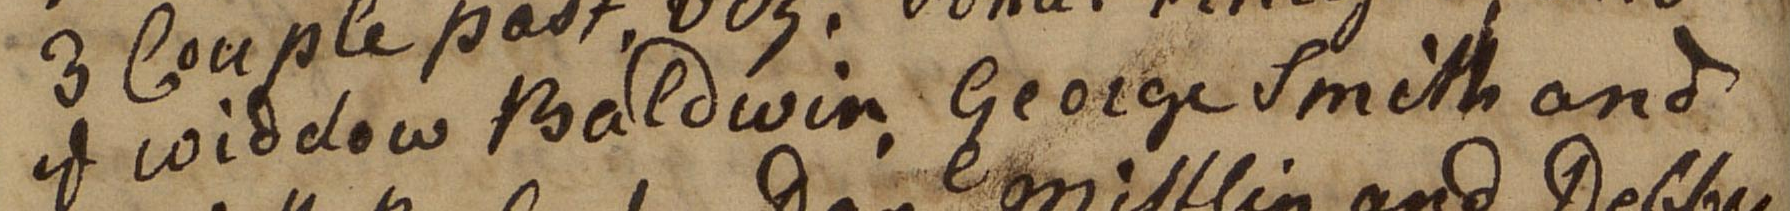y^e widdow Baldwin George Smith and
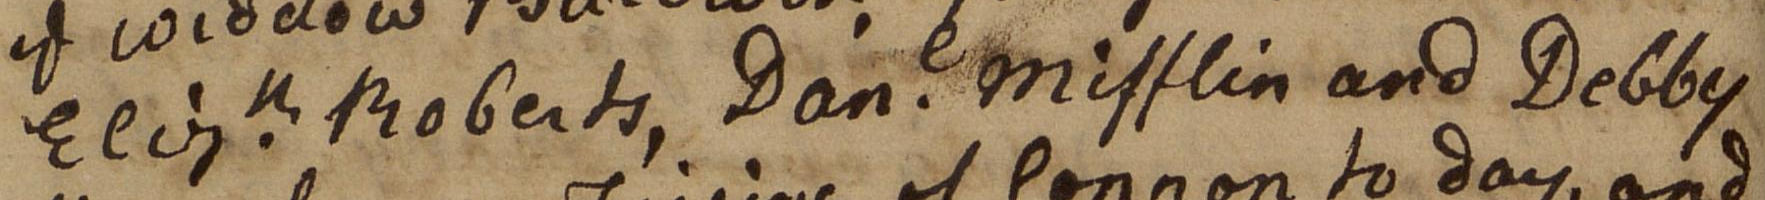Eliz^th. Roberts, Dan^l Mifflin and Debby
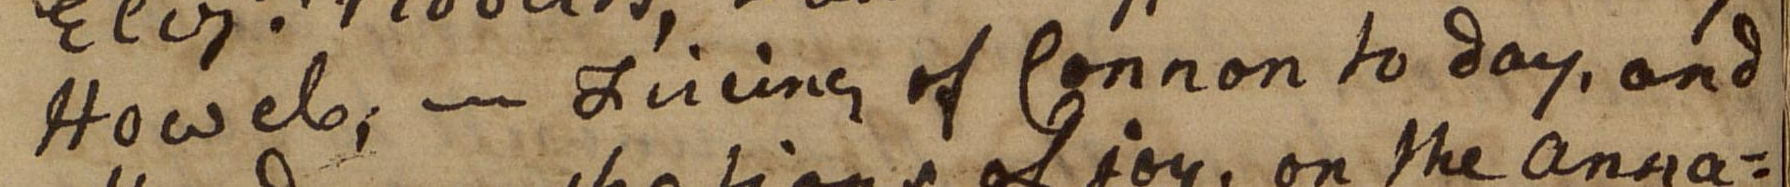Howels- Firing of Cannon to day, and
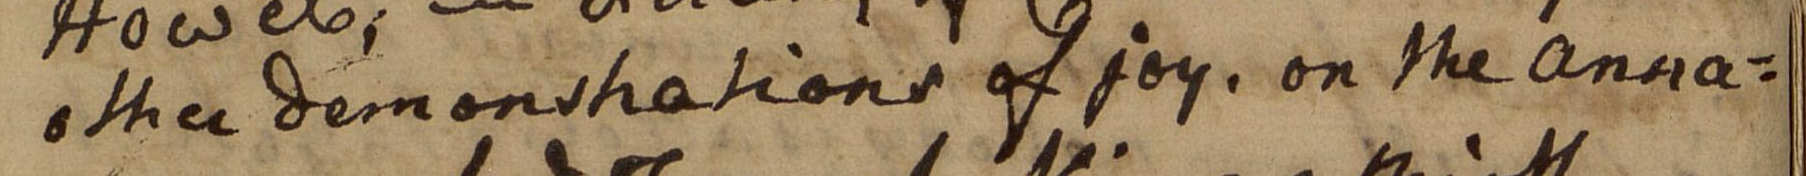o thee demonstrations of joy. on the Anna-
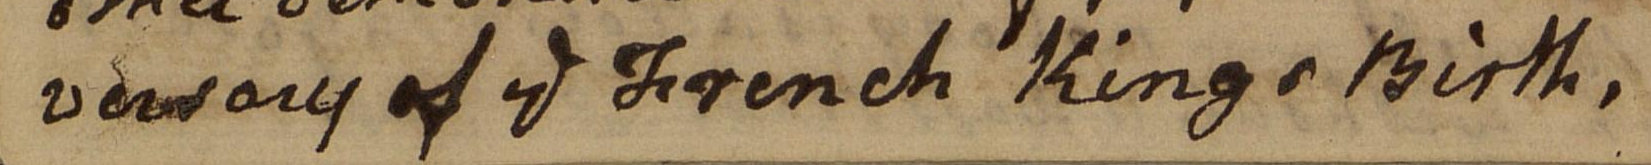versary of y^e French Kings Birth,
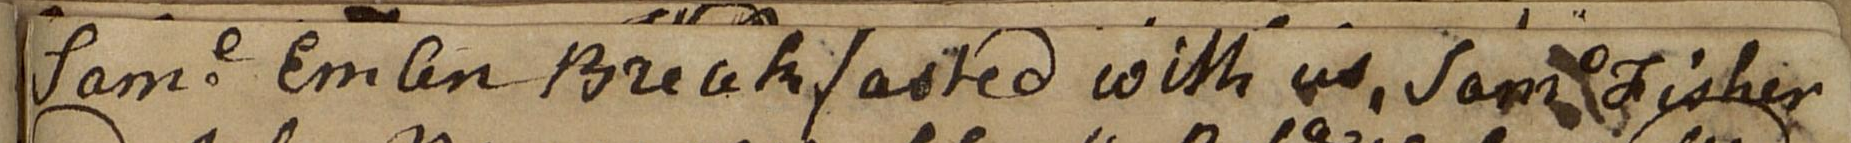I ame Emlen Breakfasted with us, Saml Fisher
